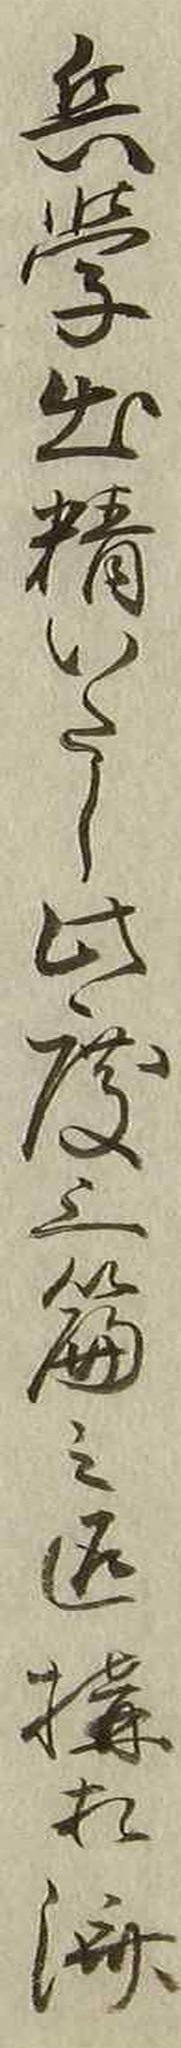兵学出精いたし此度三篇之返構相済
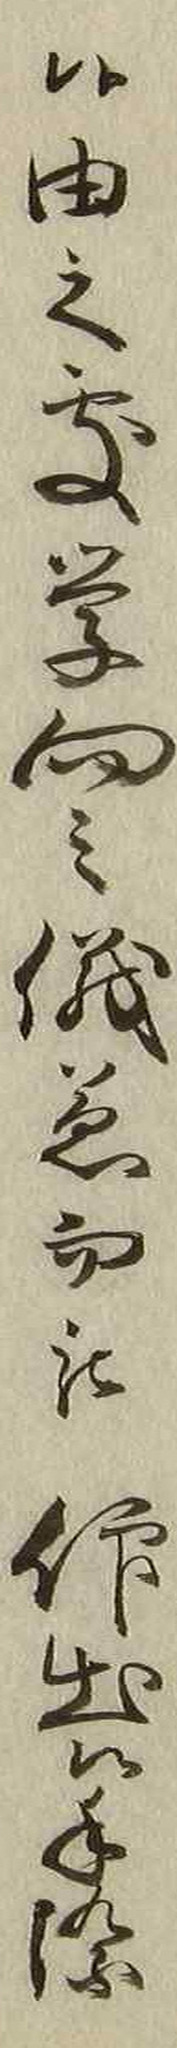候由之処学向之儀兼而被仰出候手際
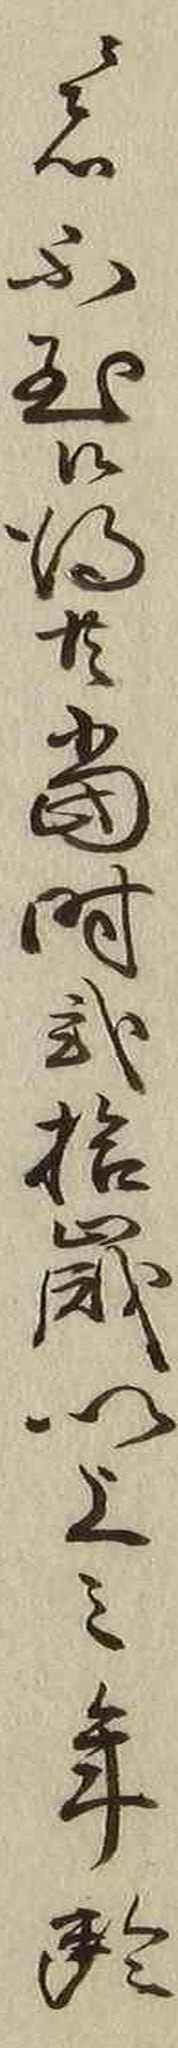ニ者不至候得共当時弐拾歳以上之年齢
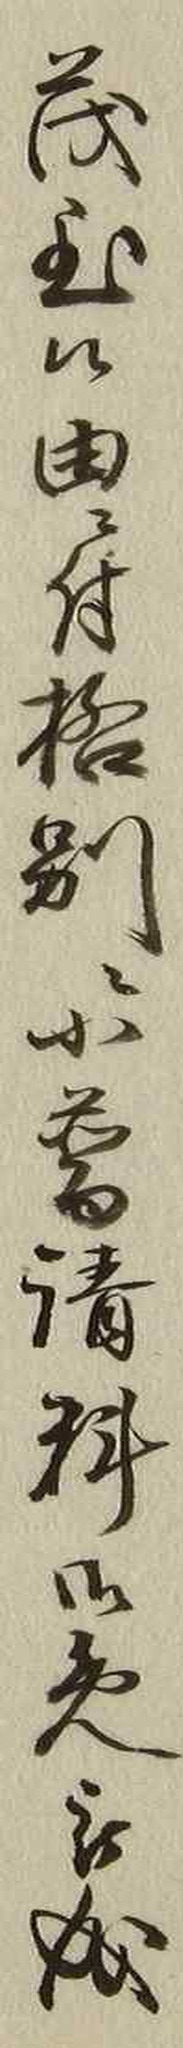も至候由ニ付格別ニ小普請料御免被成
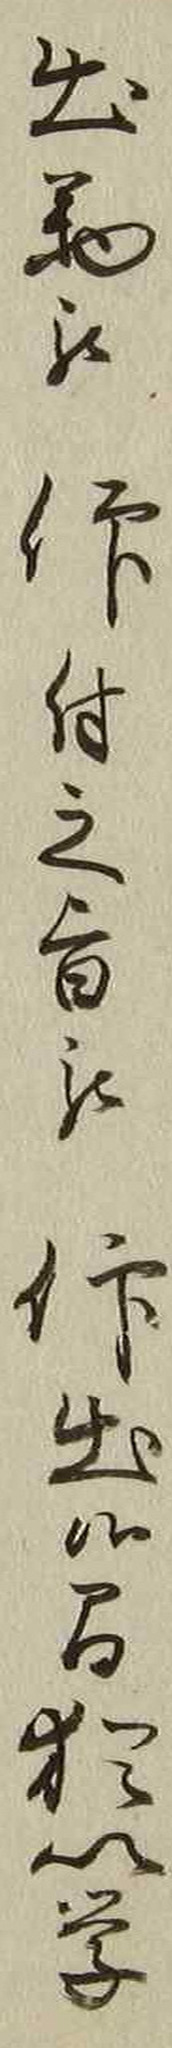出勤被仰付之旨被仰出候間猶以学
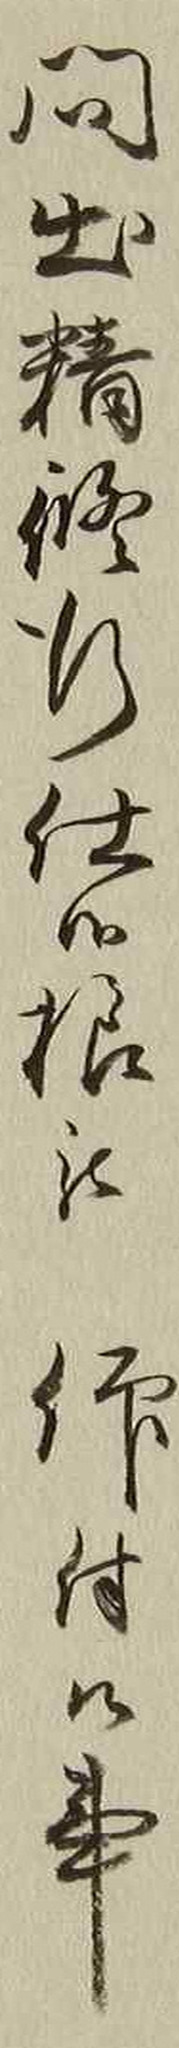問出精修行仕候様被仰付候事
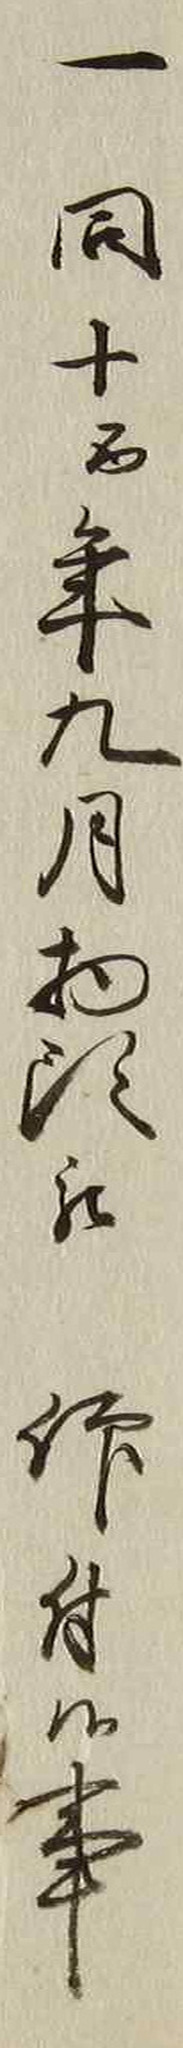一同十酉年九月物頭被仰付候事
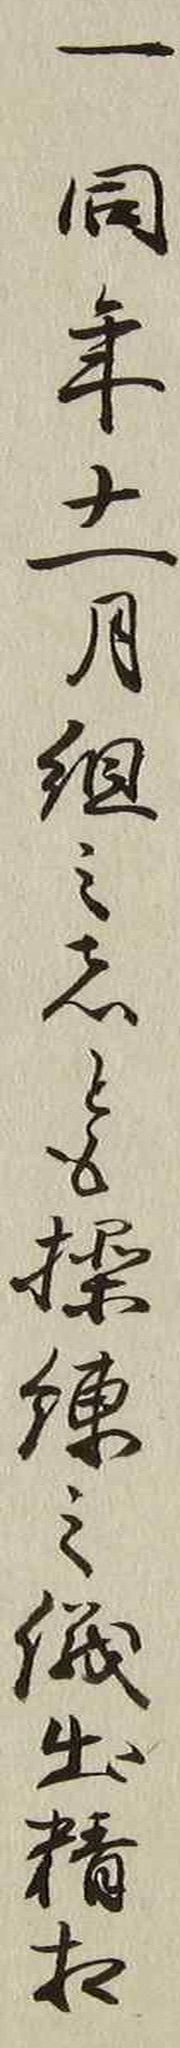一同年十一月組之者とも操練之儀出精相
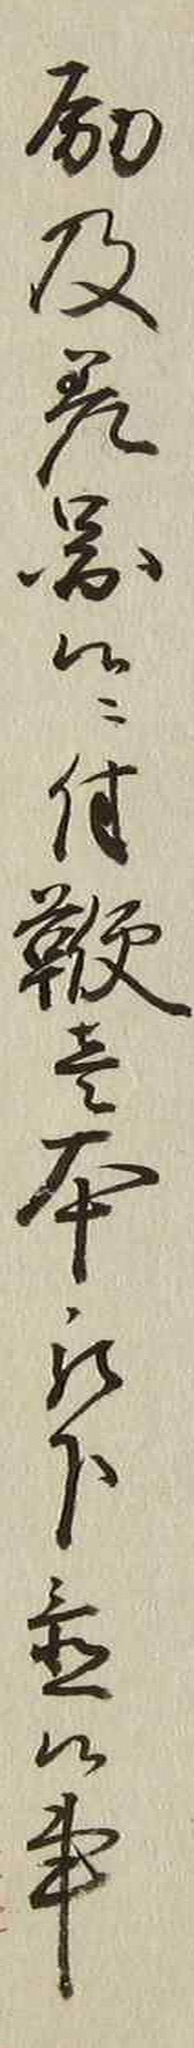励及差図候ニ付鞭壱本被下置候事
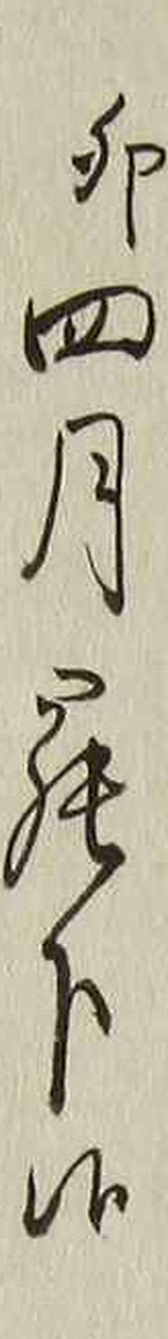卯四月罷下候
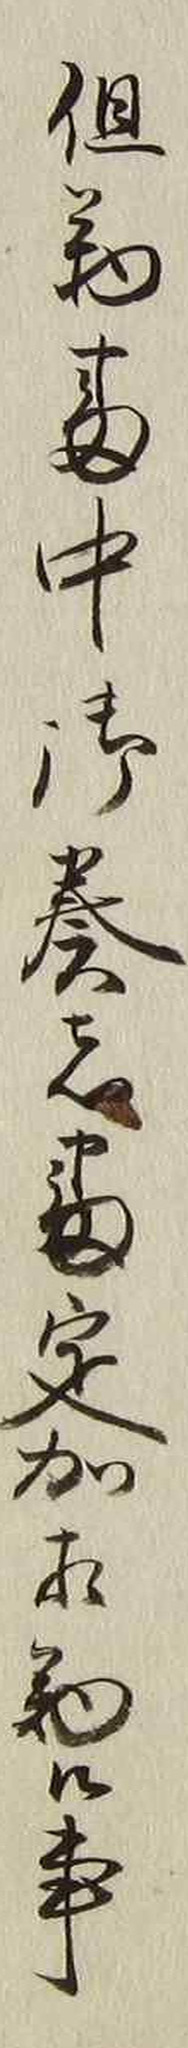但勤番中御奏者番定加相勤候事
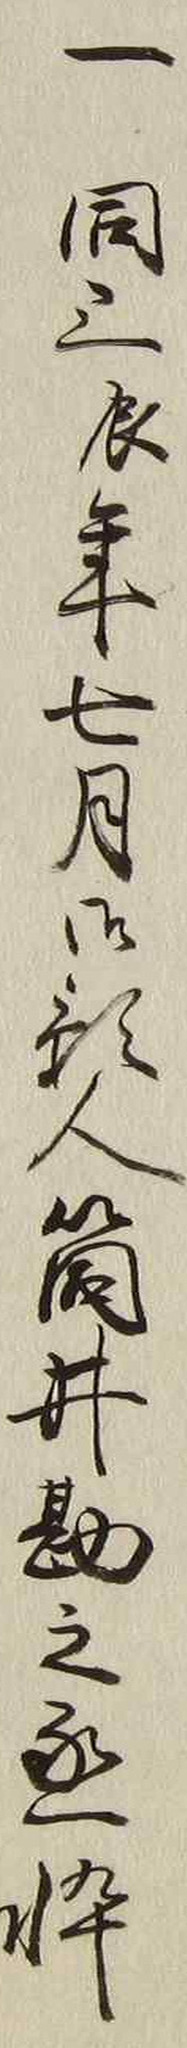一同三辰年七月御預人筒井勘之丞忰
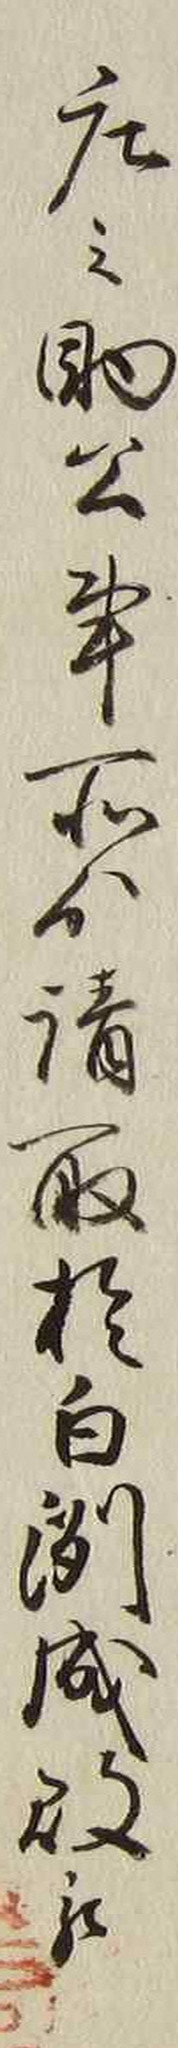庄之助公事所ゟ詣取於白洲成敗被
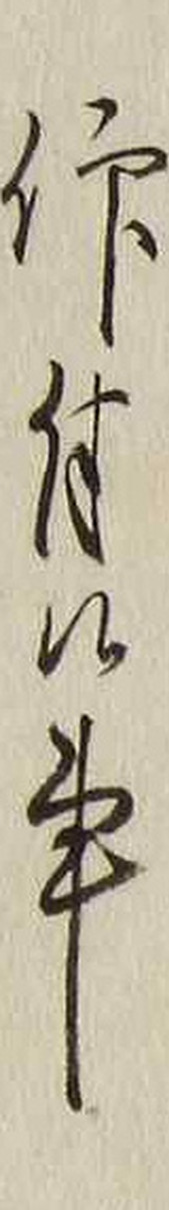仰付候事

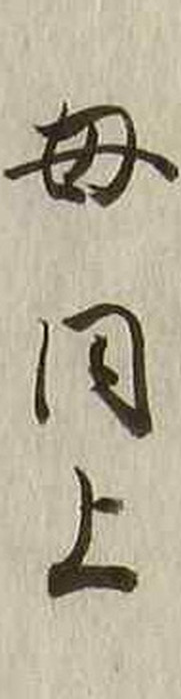母同上
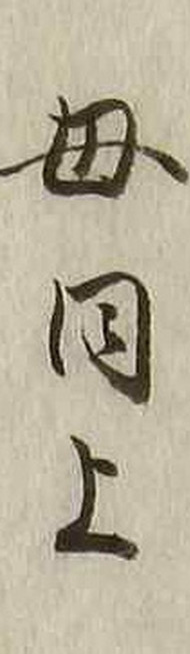母同上
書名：諸士系譜　巻之15　い之部15
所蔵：会津若松市立会津図書館
